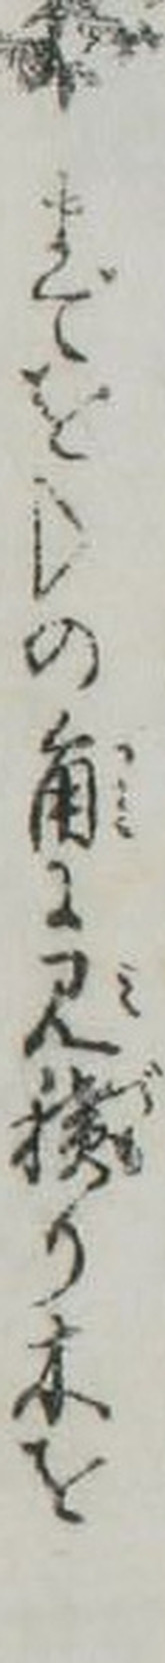までを▷の角に見積り木を
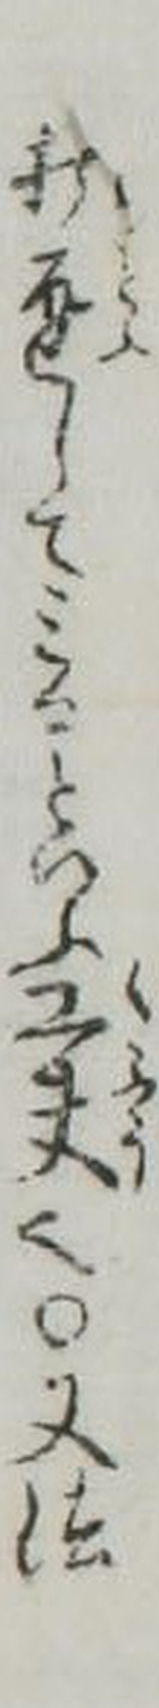折通してみるといふ工夫也○又法
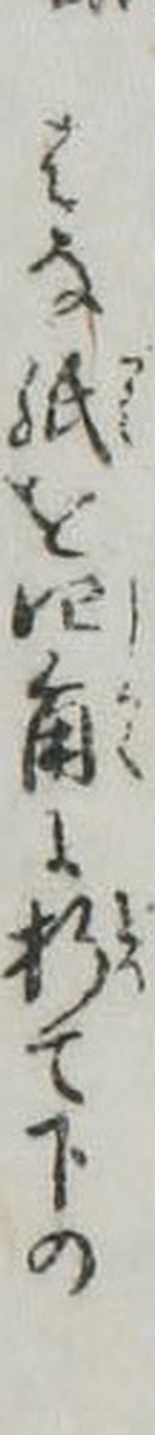はな紙を四角に折て下の
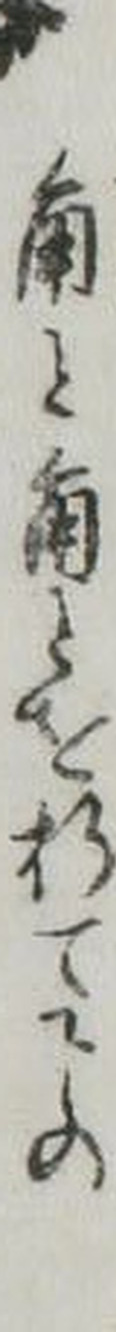角と角とを折て下の
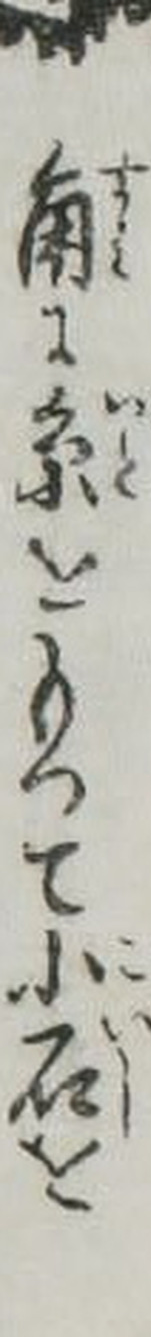角に糸をもつて小石を
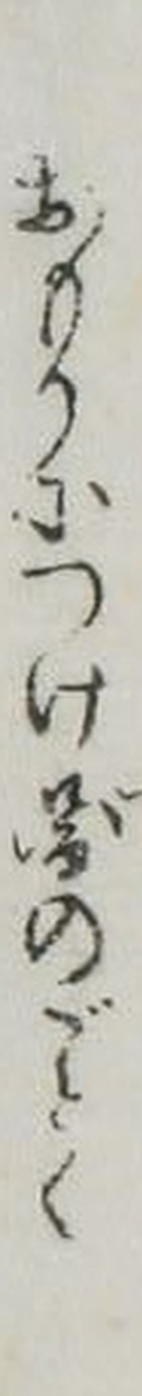おもりにつけ図のごとく
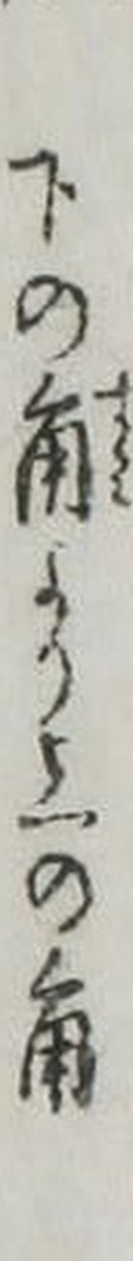下の角より上の角
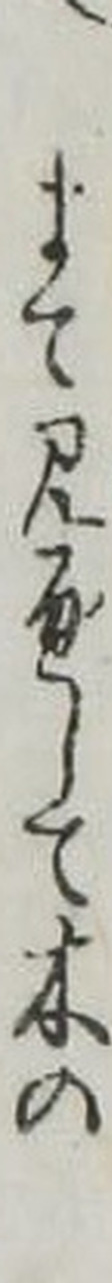まて見通して木の
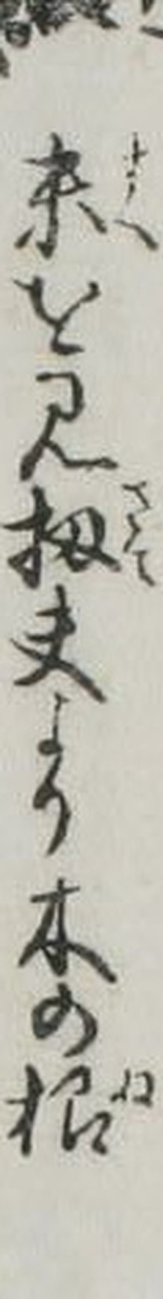末を見扨夫より木の根
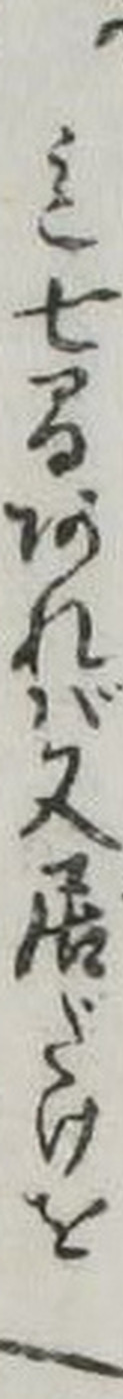迄七間あれば又居だけを
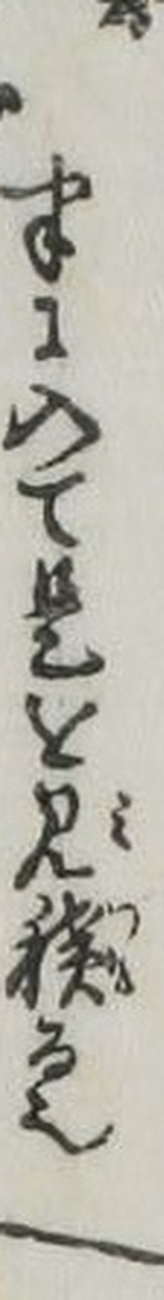半に入て是を身積る也
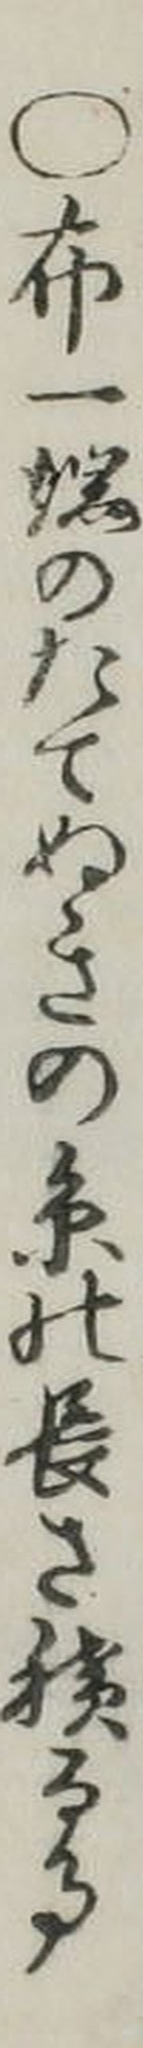○布一端のたてぬきの糸の長さ積る事
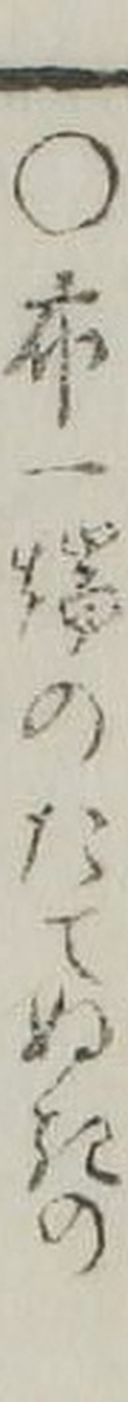○布一端のたてぬきの
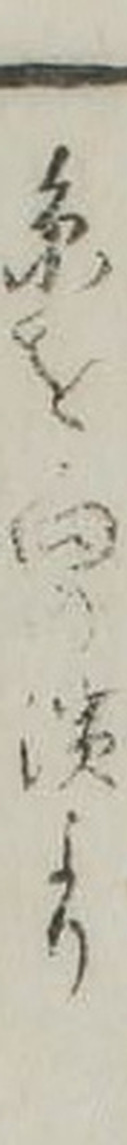糸を向の浜より
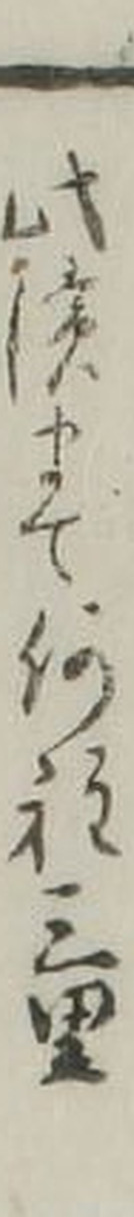此浜まて何程三里
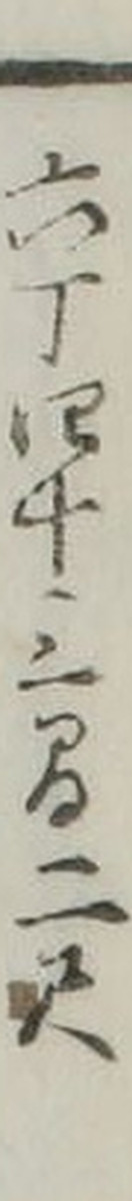六丁四十三間二尺
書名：宝玉塵劫記
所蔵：東京学芸大学教育コンテンツアーカイブ
